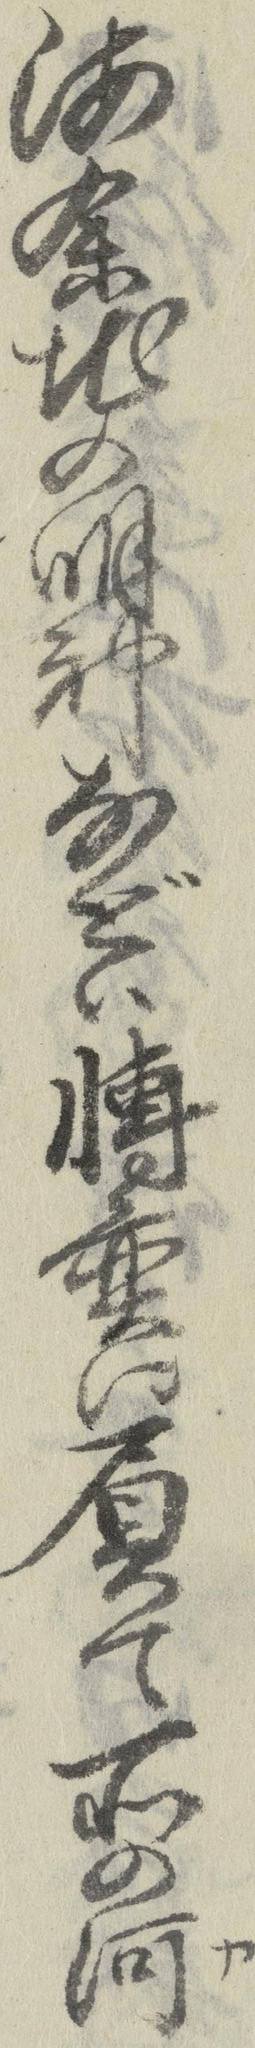海余地の明神などは博奕は負て所の河
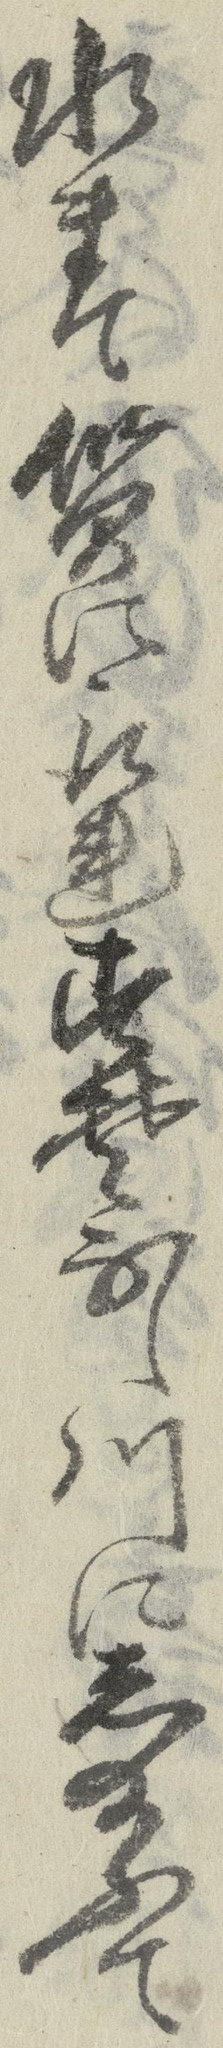水まて質に取れすそなし川にし給ふて
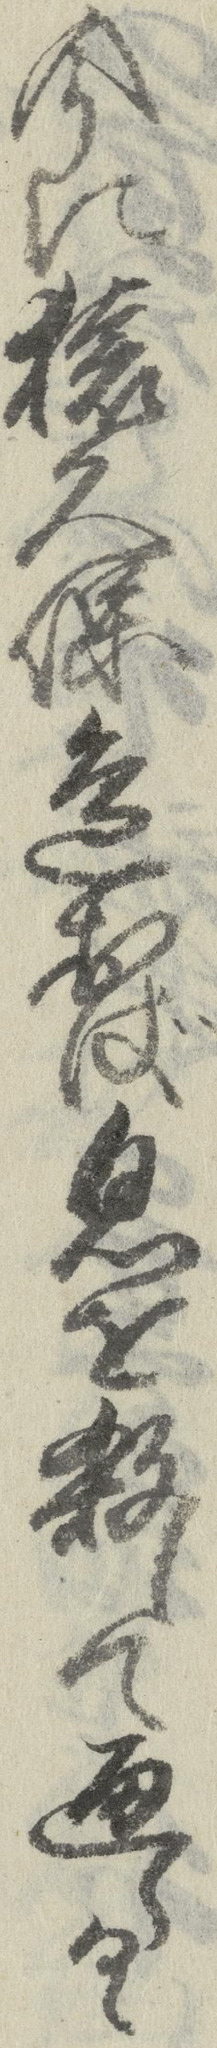今に猿久保辺おば息を殺して通らるゝ
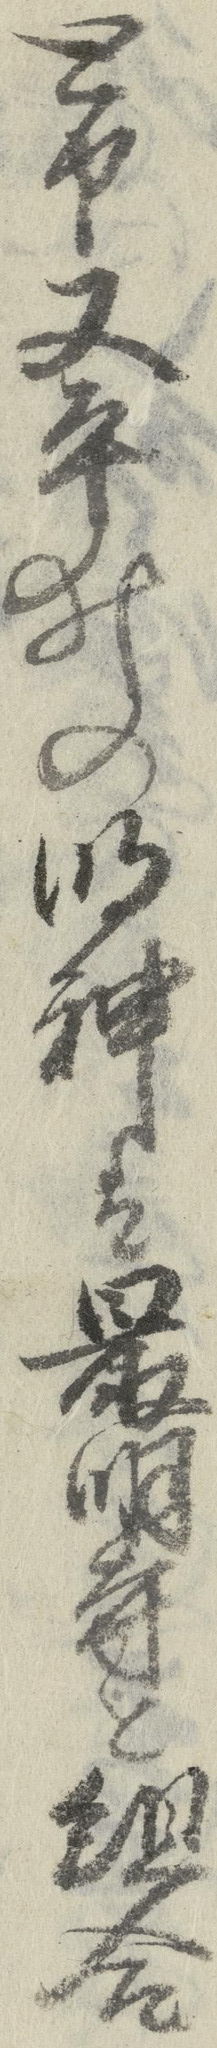と申又平井の明神は最明寺と組合
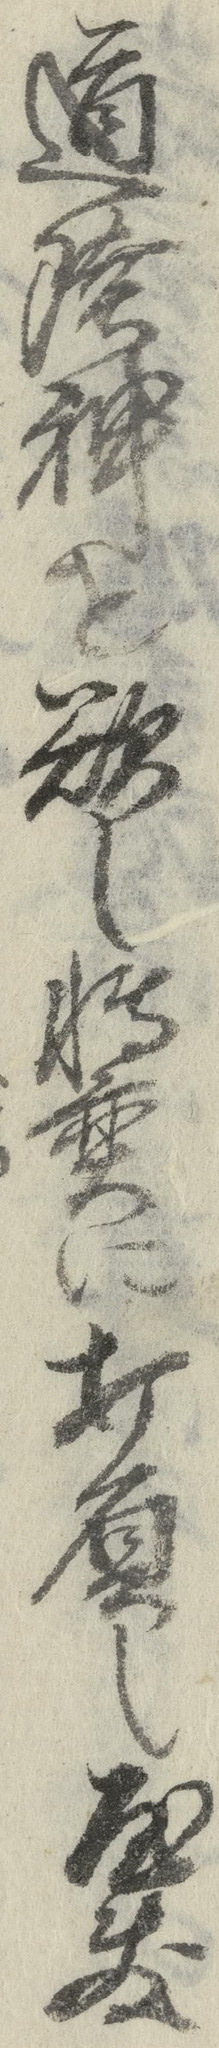道陸神を欲し博奕に打屓し屋敷
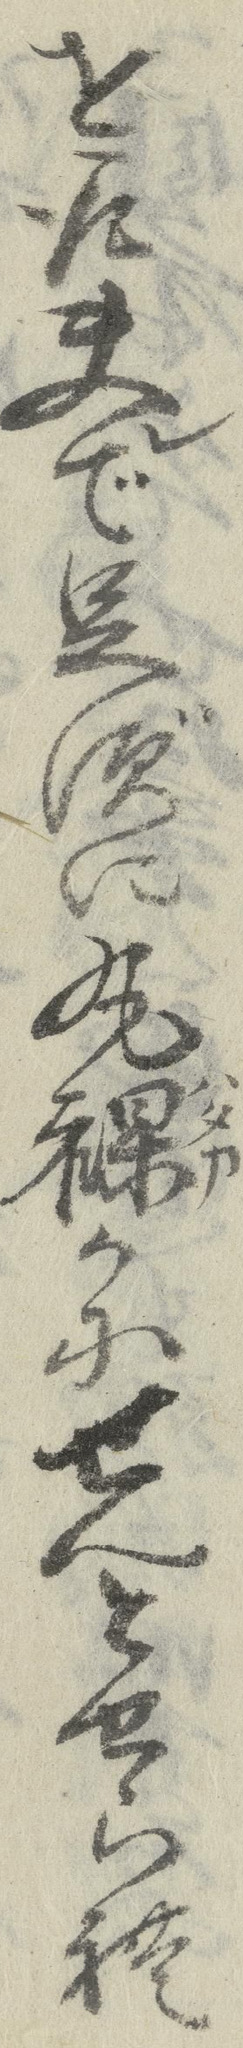を取夫で足ずに丸裸かにせんとセられ
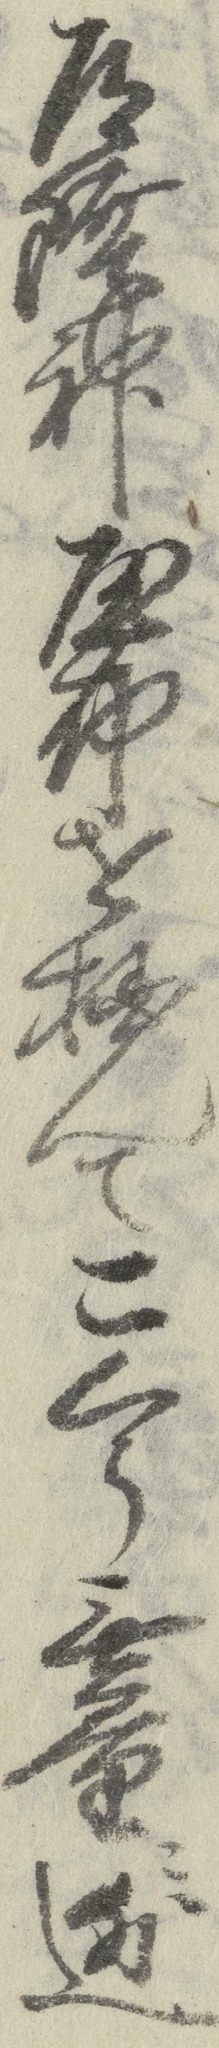道陸神屋布を極んてこくう無量に迯
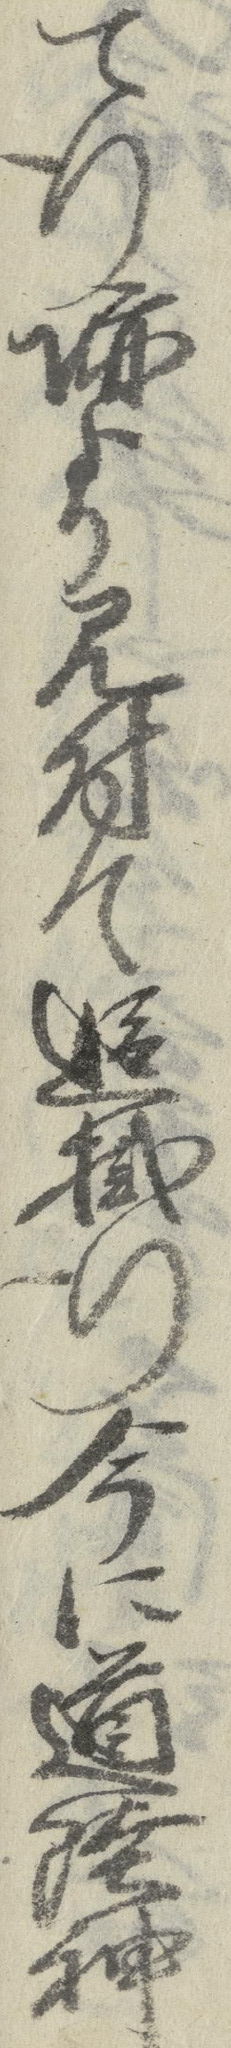て行跡より見付て追掛り今に道陸神
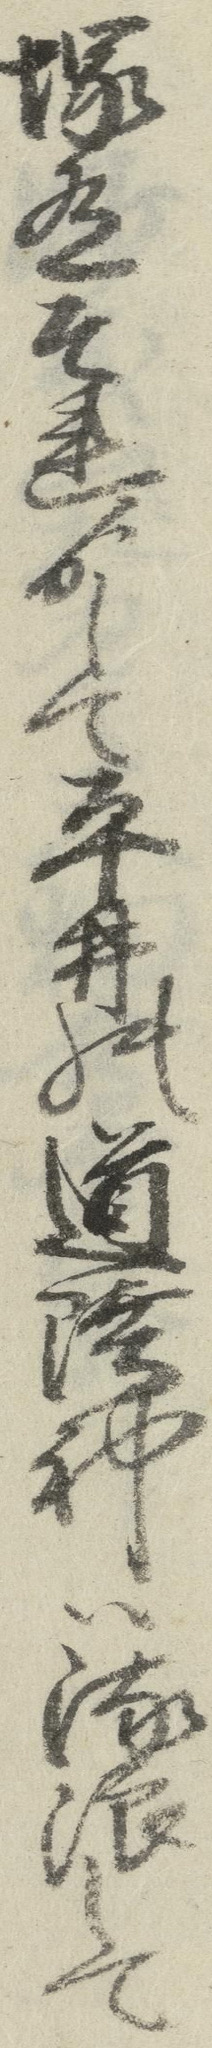塚ありそれゟして平井の道陸神は流浪して
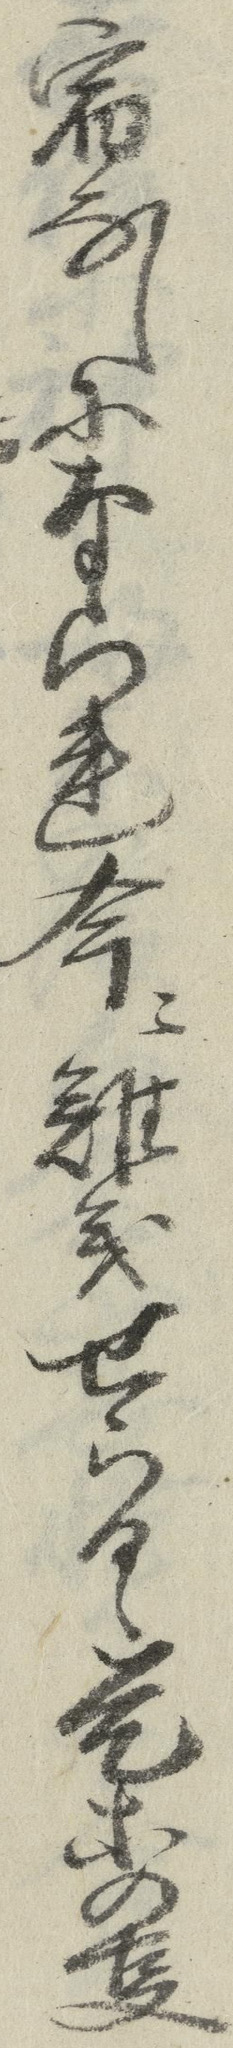宿なしになられ今に難義せらるゝ是等の事
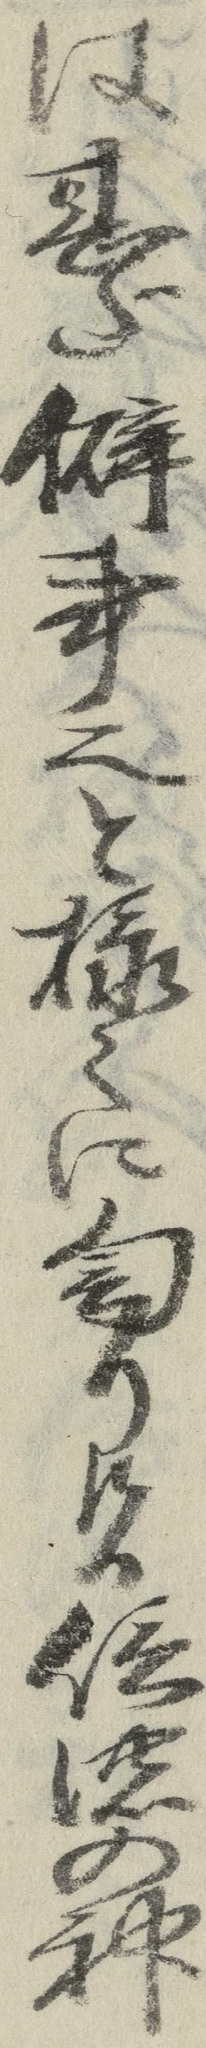は甚だ僻事也と様々に訇り候而信濃の神
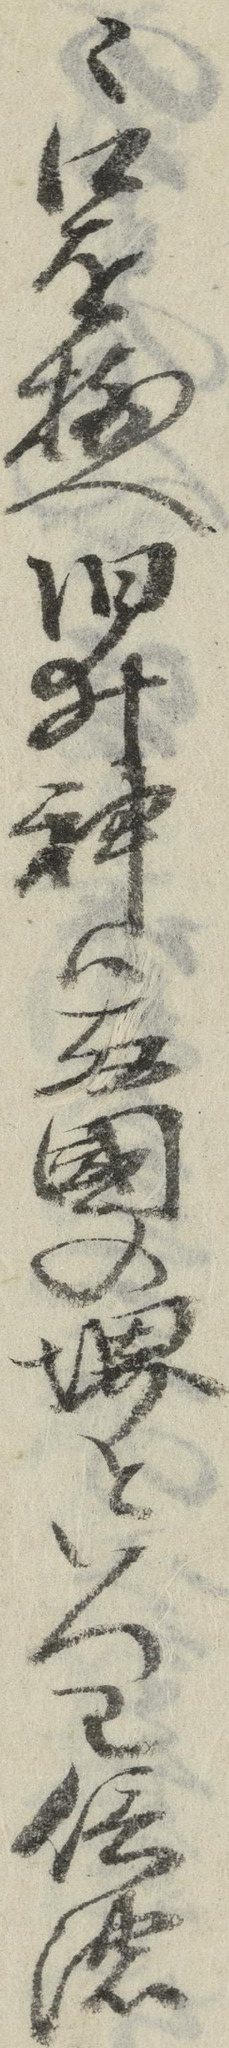々口を揃へ旧井神は両国の堺といつわ信濃
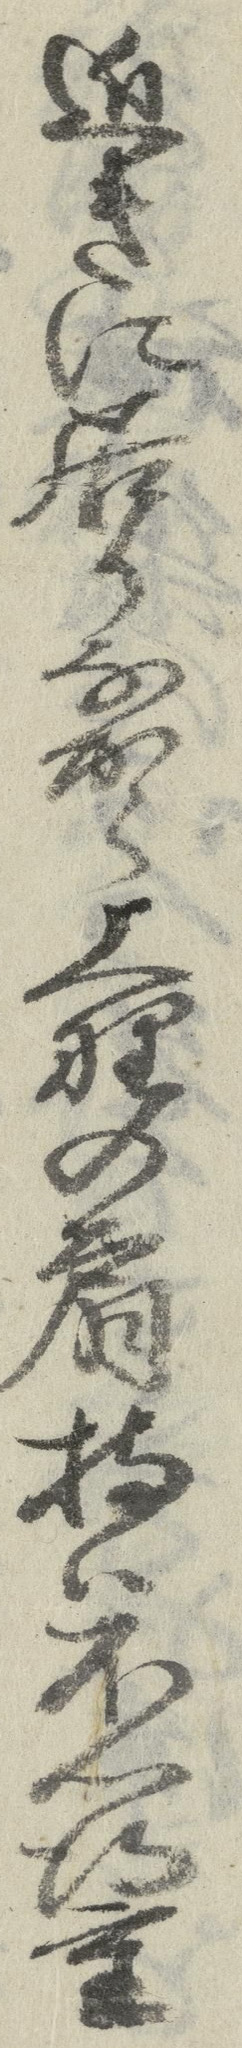迫きに居りなから上野の肩持は不心得重
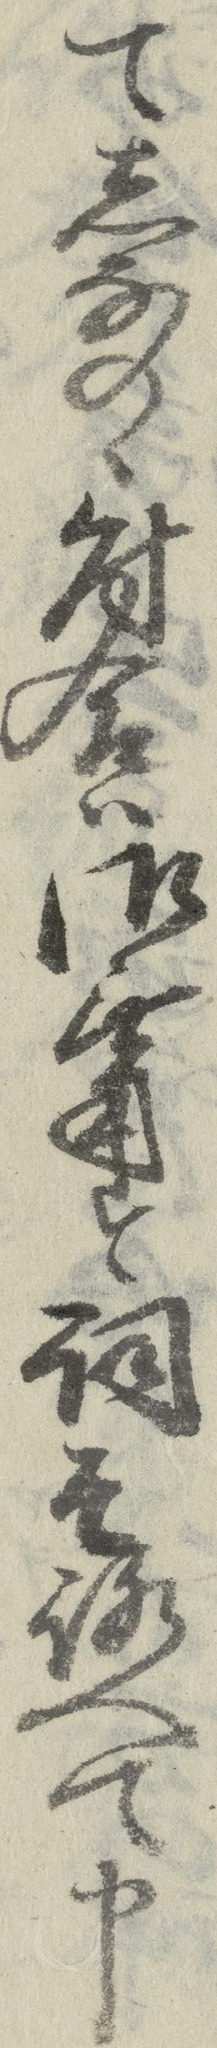てしなのヽ付合は御無用と祠そろへて申
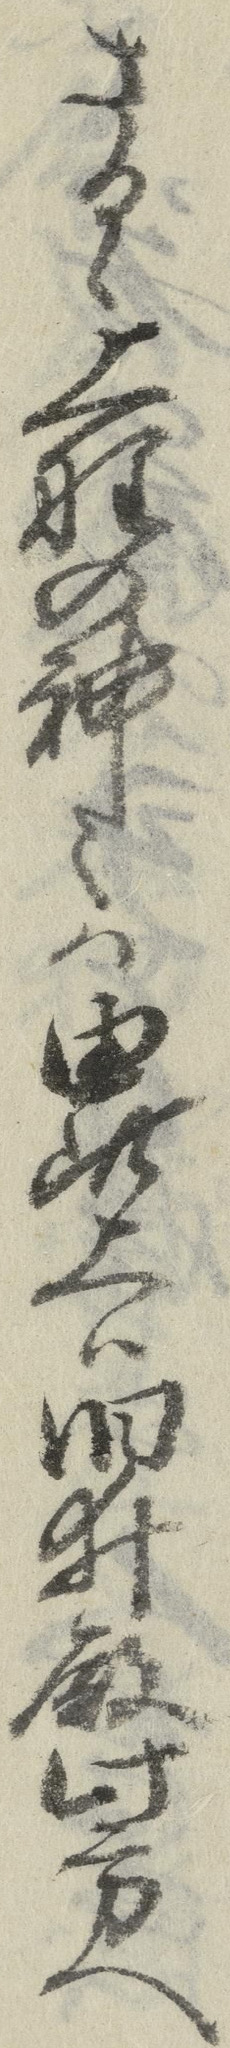さるヽ上野の神々は由此上は旧井殿此方へ
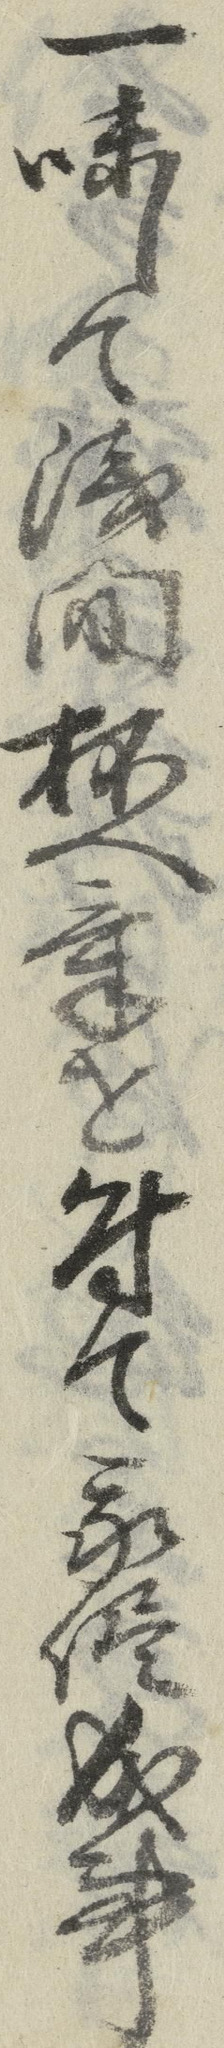一味して浅間抔へ気を付て我禮成事
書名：浅間大焼騒動記　上
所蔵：東京大学地震研究所図書室 Earthquake Research Institute Library, The University of Tokyo, JAPAN
